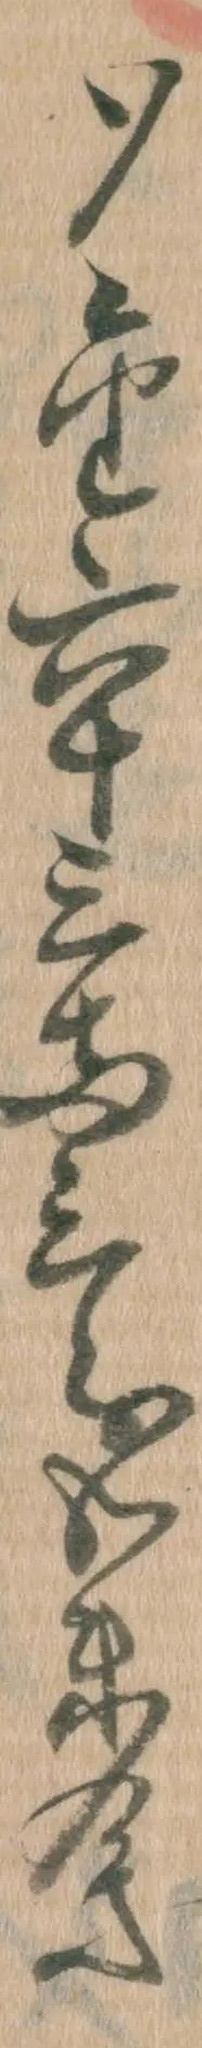〆金六十三両三分弐朱
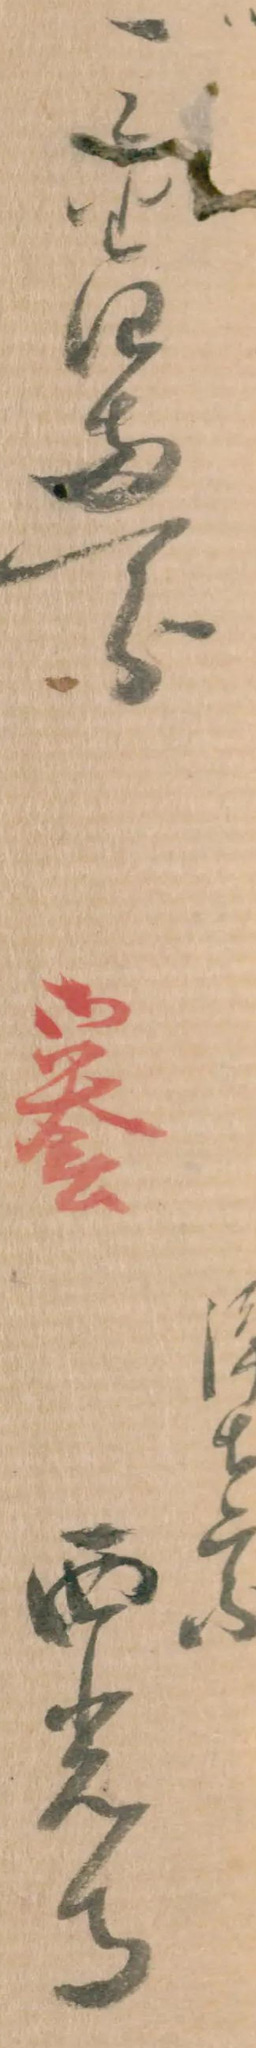一金四両一分御誉西光寺
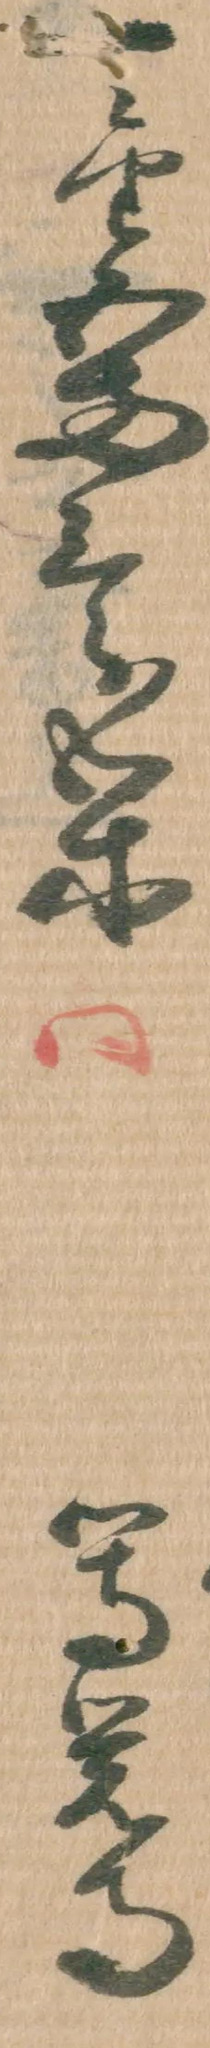一金五両三分弐朱同等覚寺
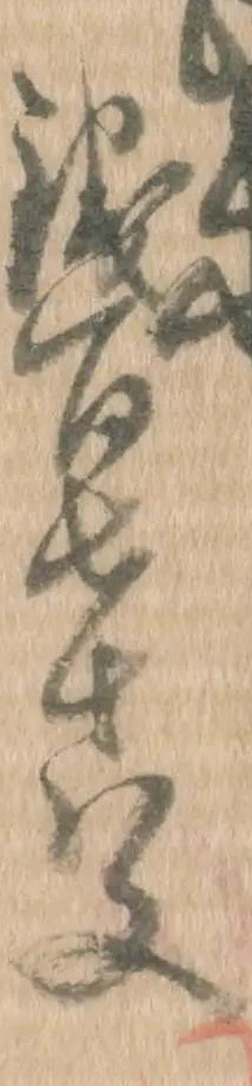銭百七十文

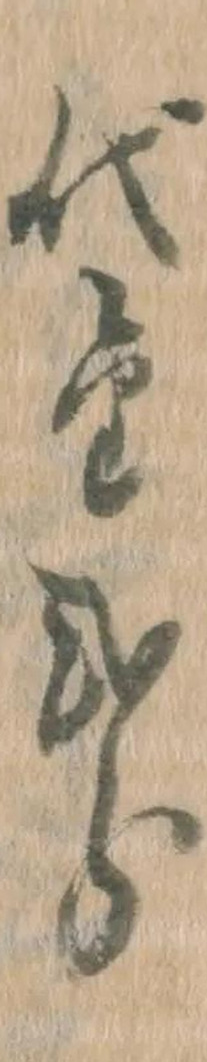代金弐分
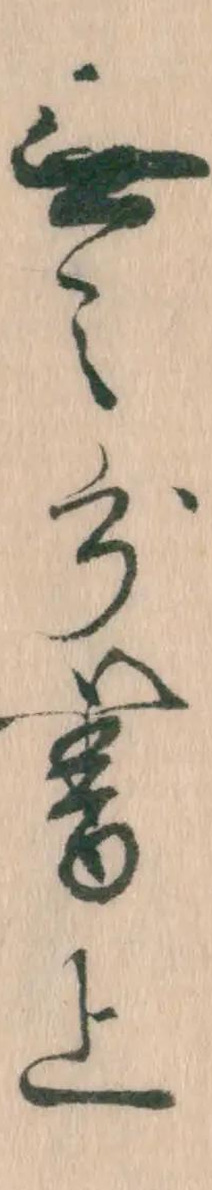無之分書上
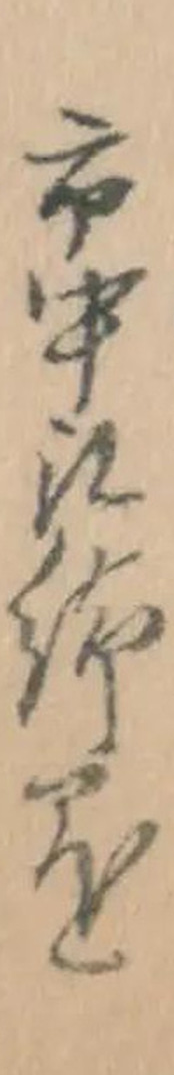市中取締懸

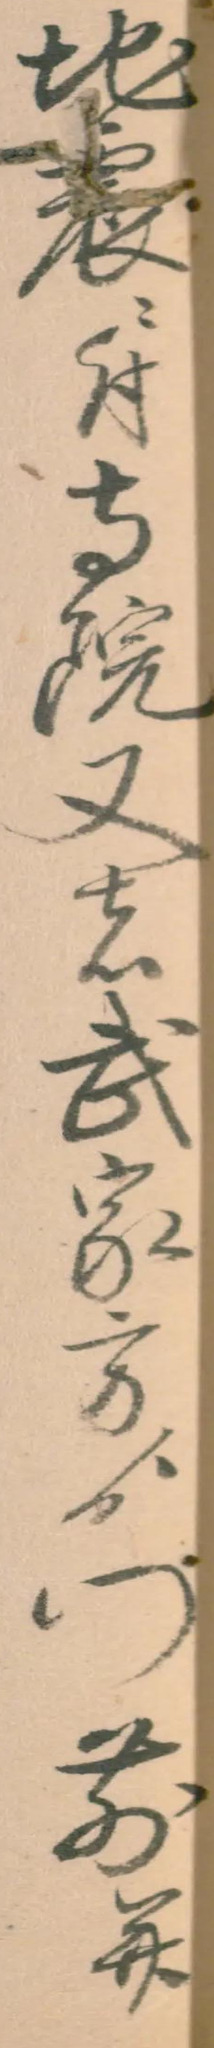地震ニ付寺院又は武家方より門前并
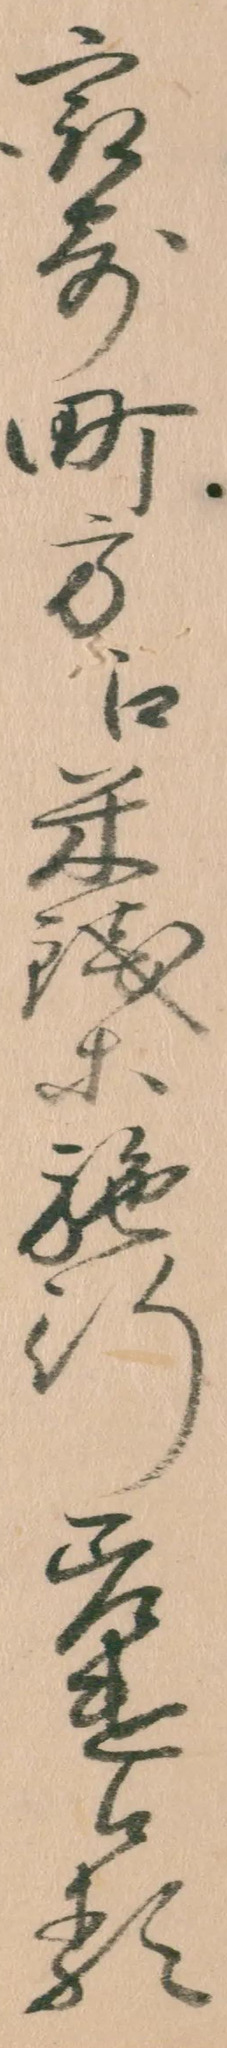最寄町方え米銭等施行差遣候類
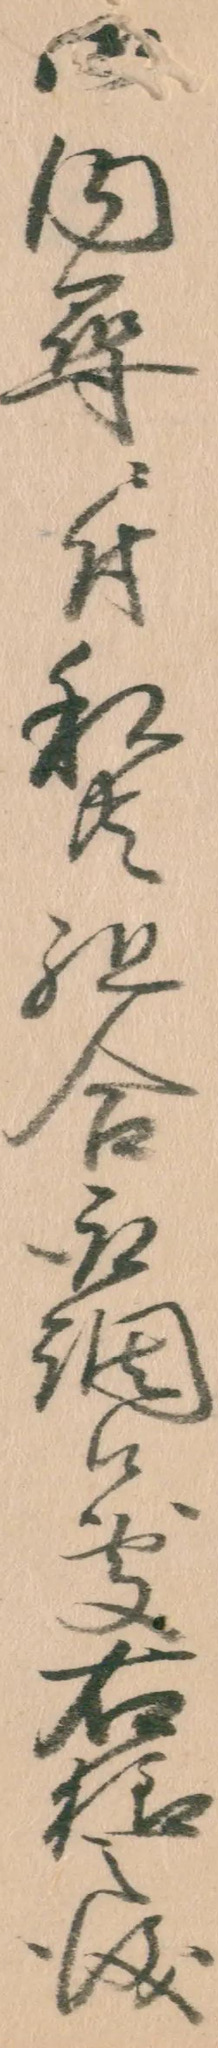御内尋ニ付私共組合取調候処右様之儀
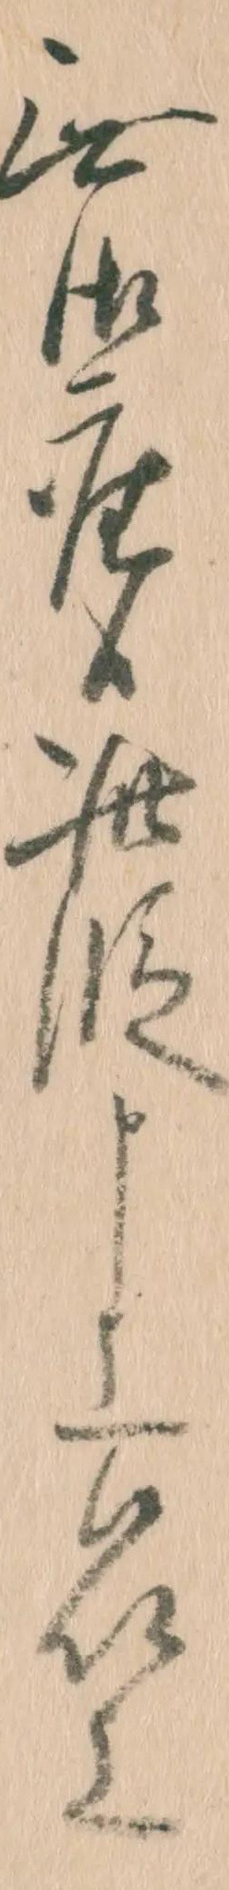無御座候此段申上候以上
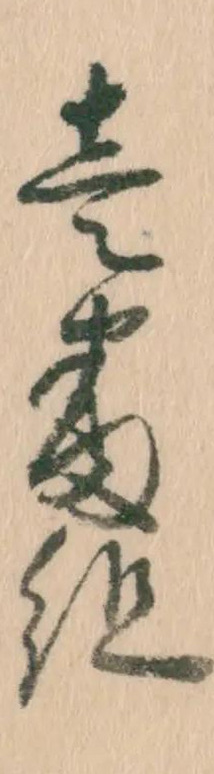壱番組
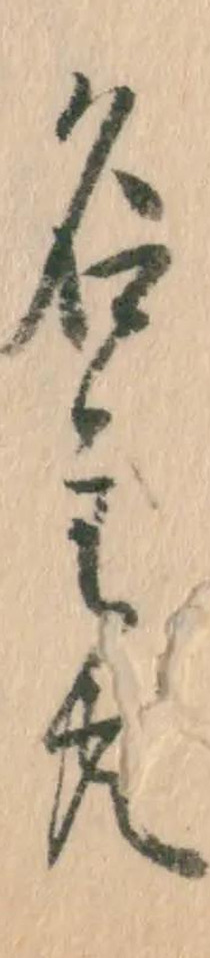名主共

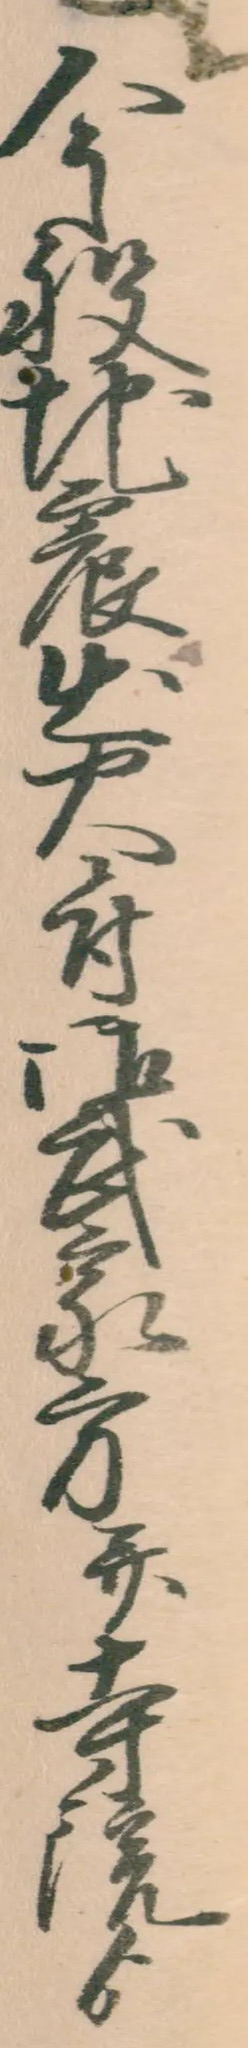一今般地震出火ニ付御武家方并寺院ゟ
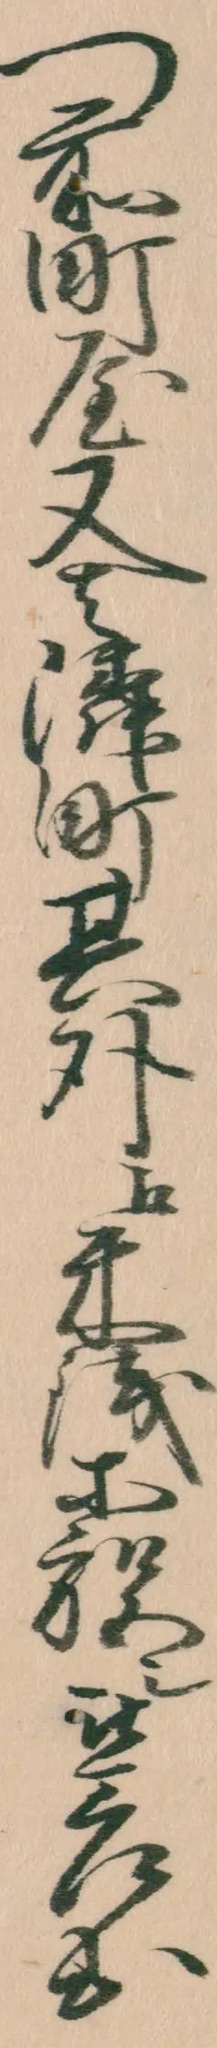門前町屋又は隣町其外え米銭等施シ被差出
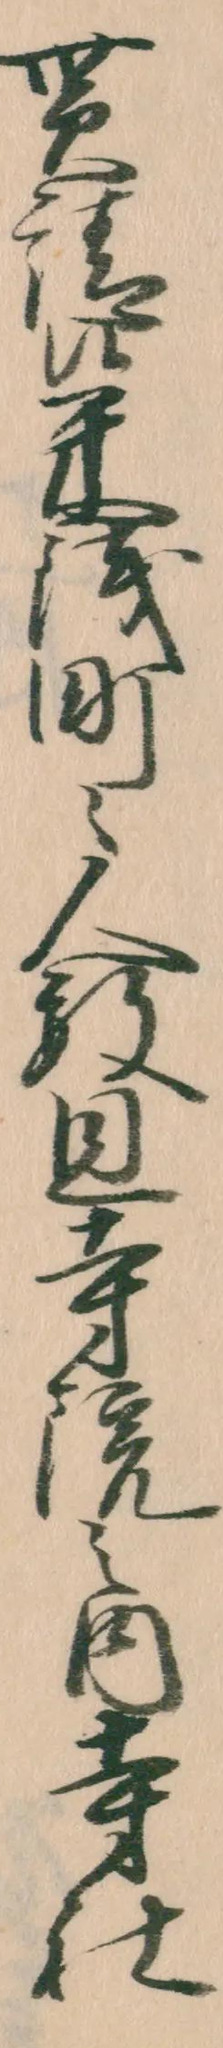貰請候米銭町々人数且寺院之内寺社
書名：武家方并寺院等ニテ施差出候一件
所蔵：国立国会図書館 National Diet Library, JAPAN
